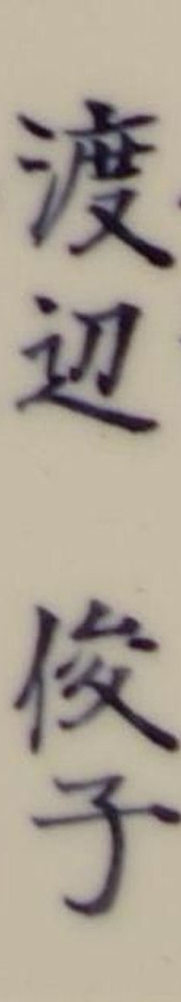渡辺俊子
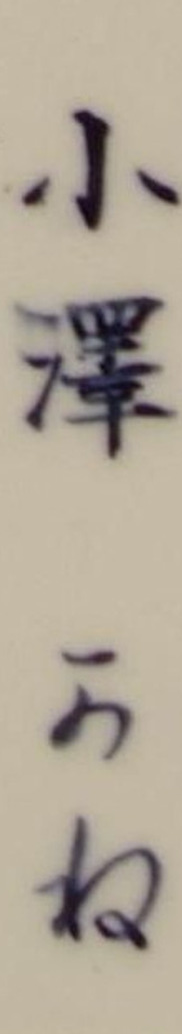小澤かね
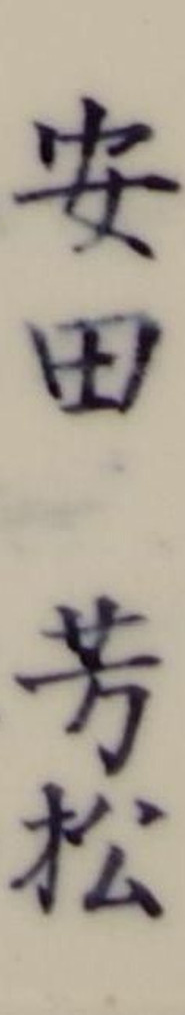安田芳松
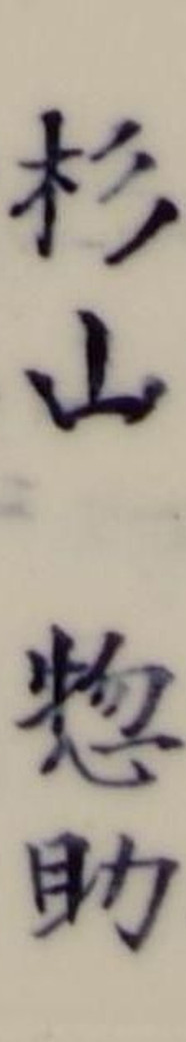杉山惣助
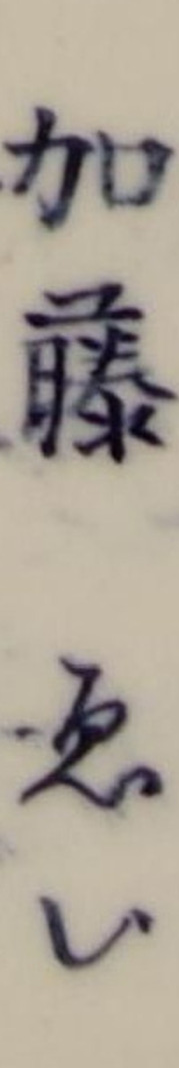加藤ゑい
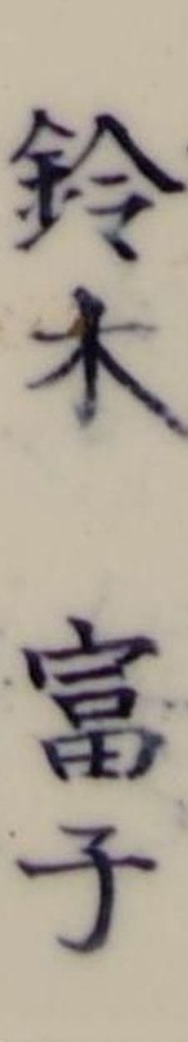鈴木富子
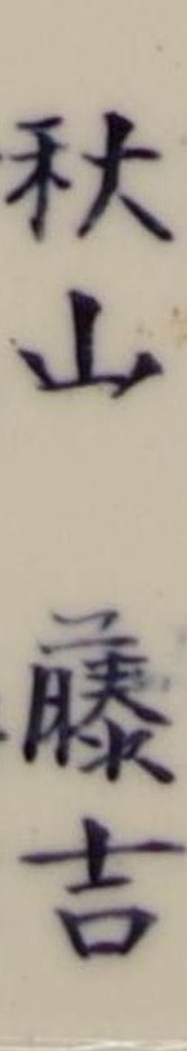秋山藤吉
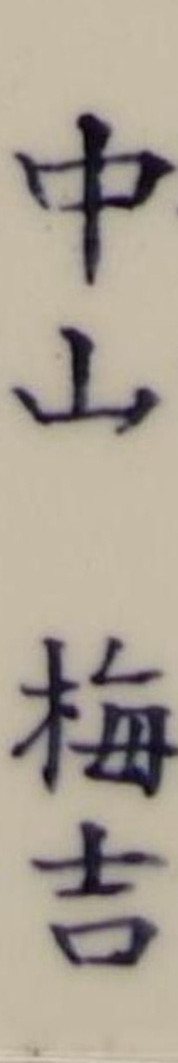中山梅吉
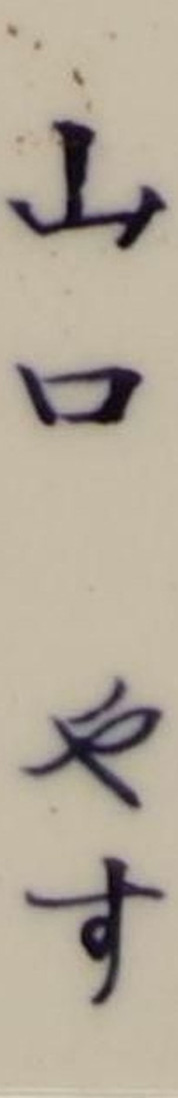山口やす
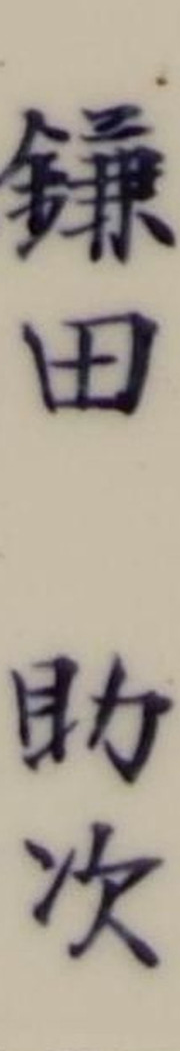鎌田助次
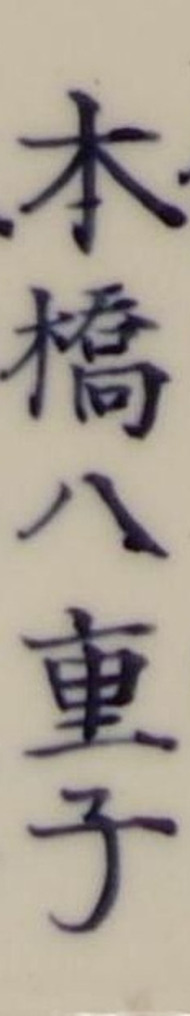本橋八重子
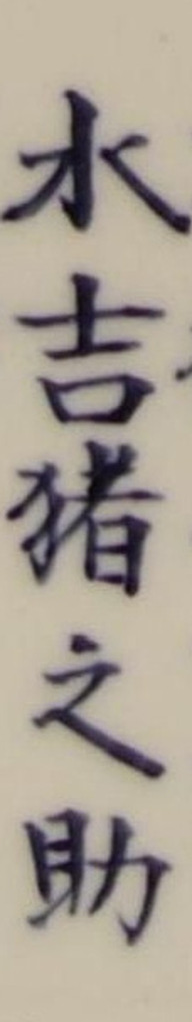水吉猪之助
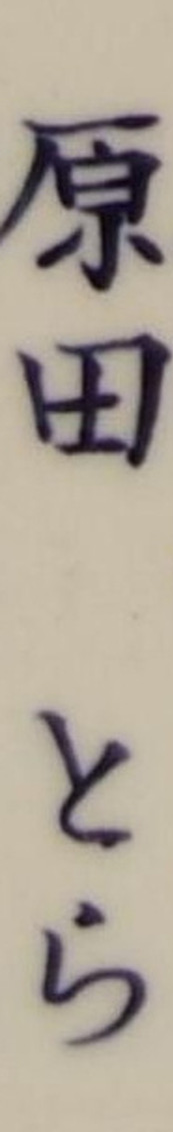原田とら
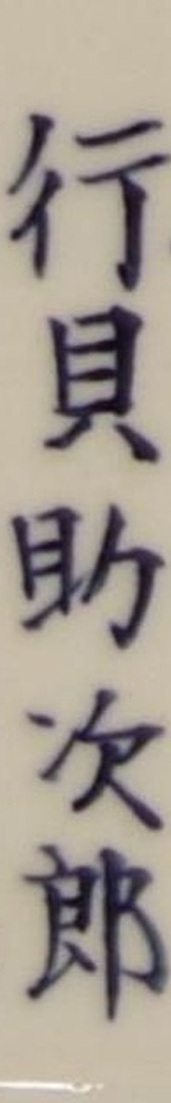片貝助次郎
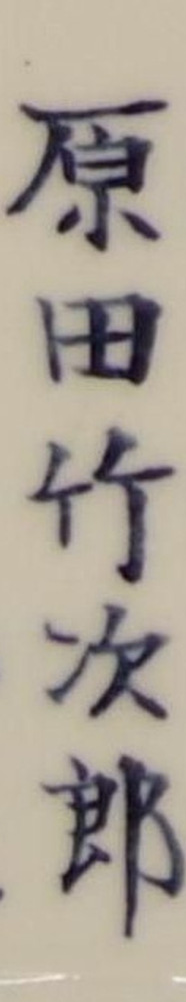原田竹次郎
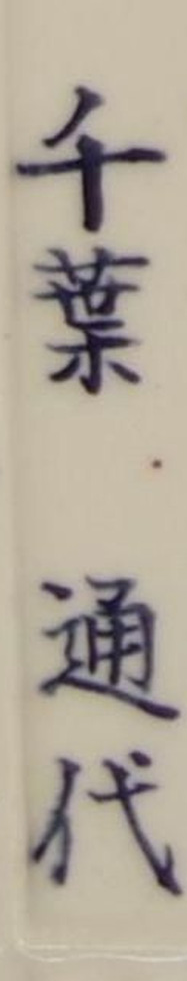千葉通代
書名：M~S
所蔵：高野山金剛峯寺
